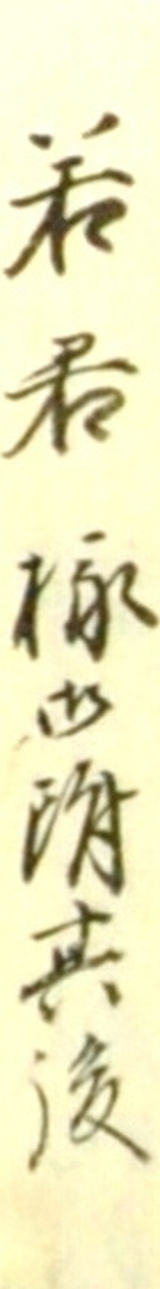若君様御附其後

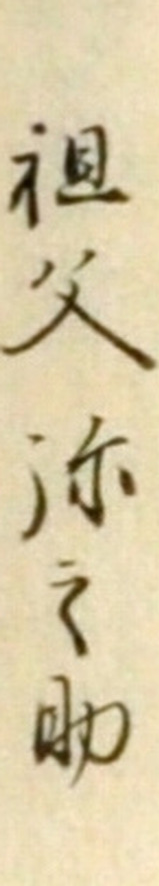祖父弥之助
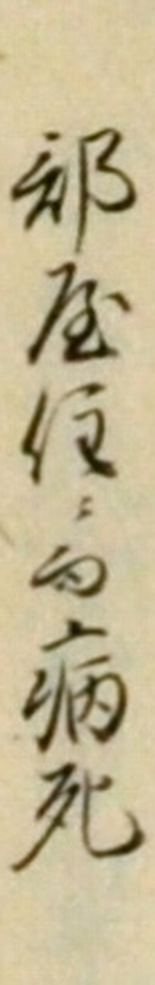部屋住ニ而病死
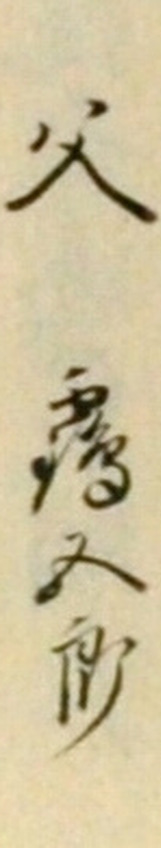父靎五郎
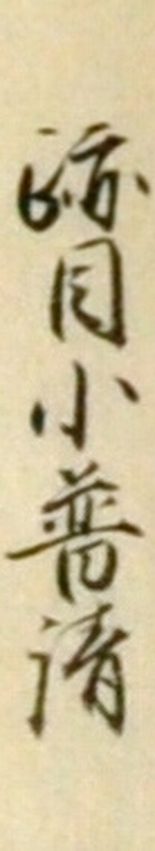跡目小普請
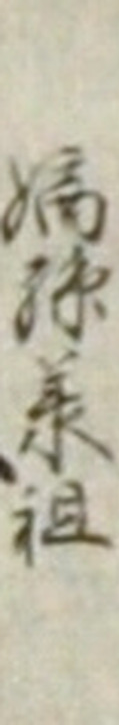嫡孫承祖
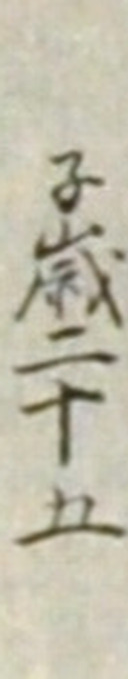子歳二十五
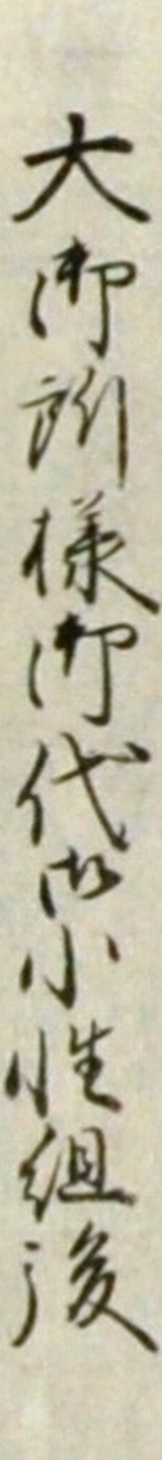大御所様御代御小姓組後
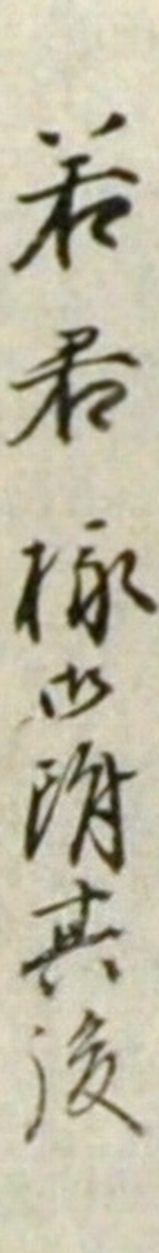若君様御附其後
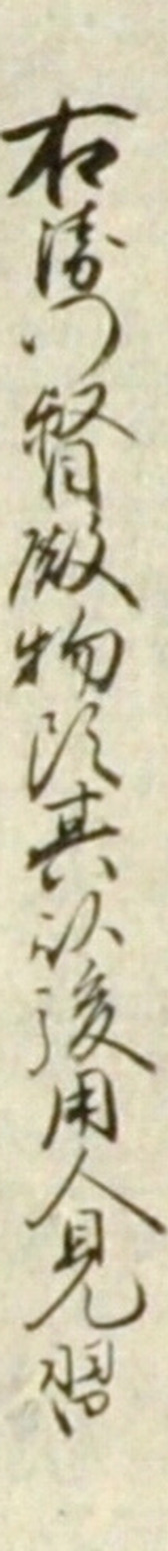右衛門督殿物頭其以後用人見習
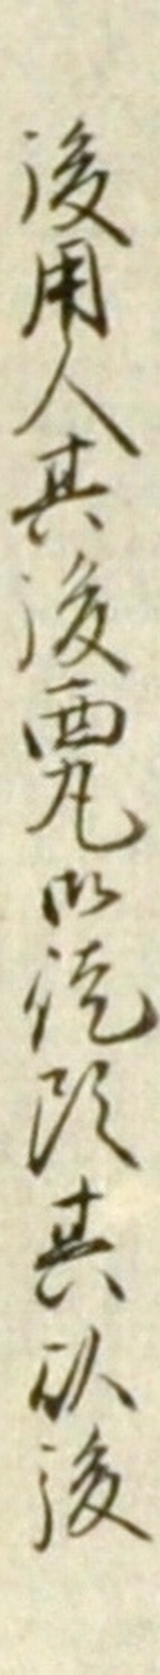後用人其後西丸御徒頭其以後
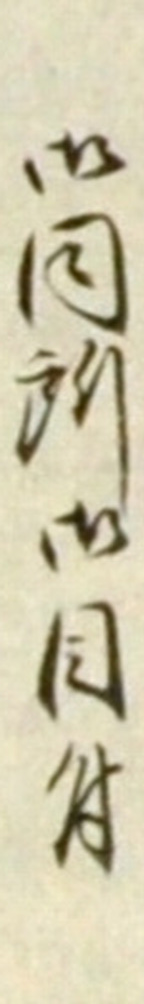御同所御目付
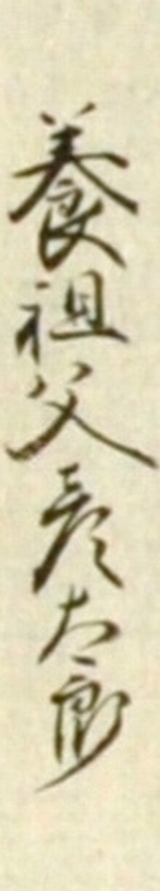養祖父彦太郎
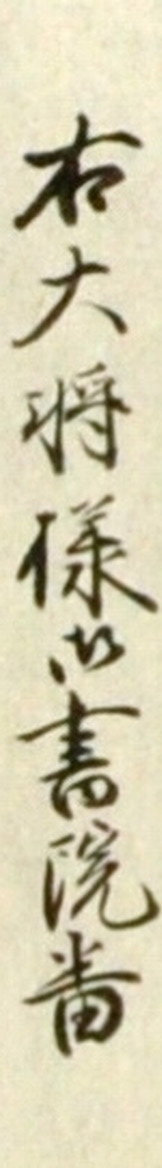右大将様御書院番
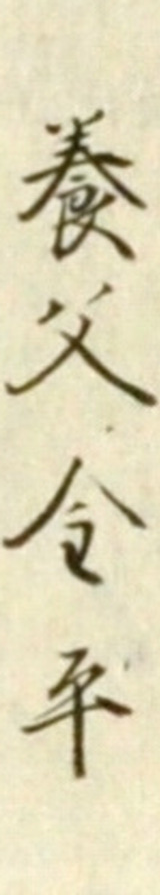養父金平
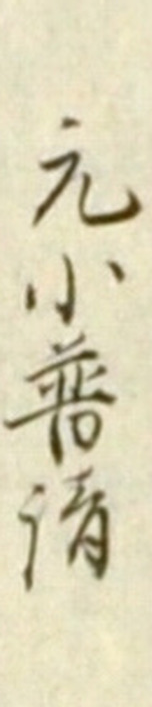元小普請
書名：若年寄御役中御調書付
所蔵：伊那市立高遠町図書館・合同会社AMANE
